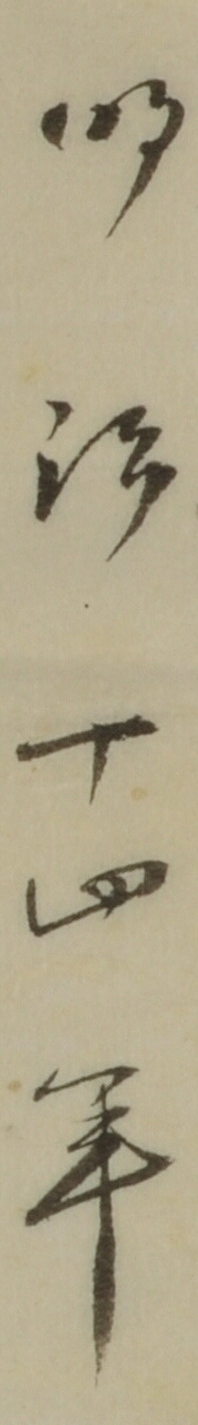明治十四年
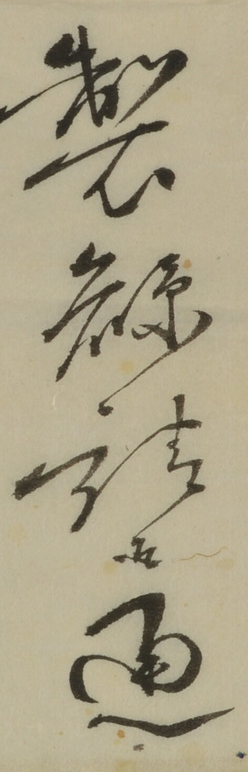製糸請取通
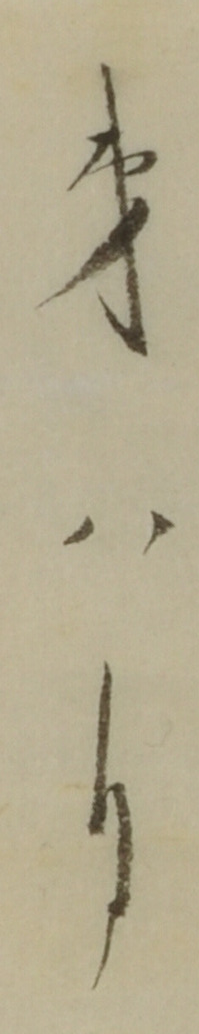第八月

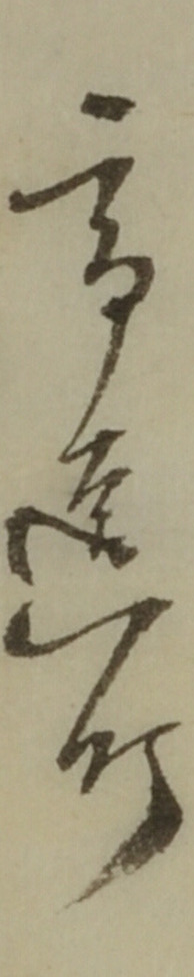高遠町
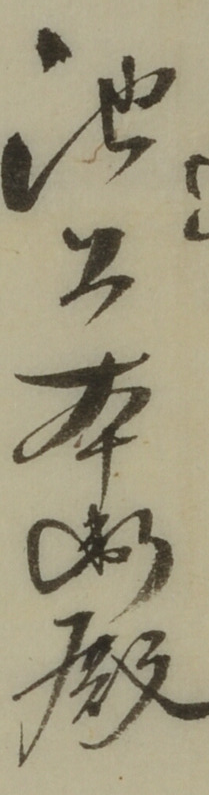池上本衛殿

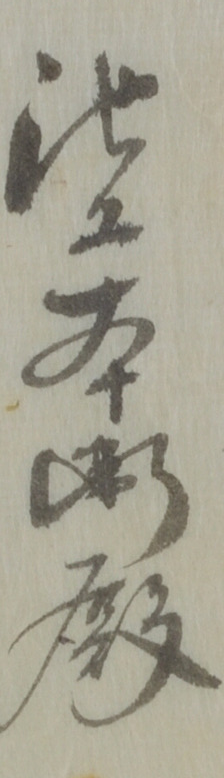池上本衛殿

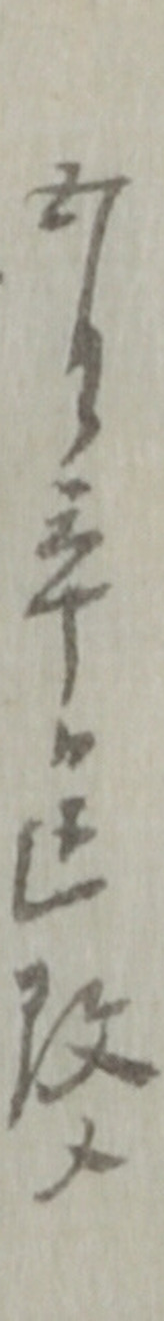五月三十日巳改メ
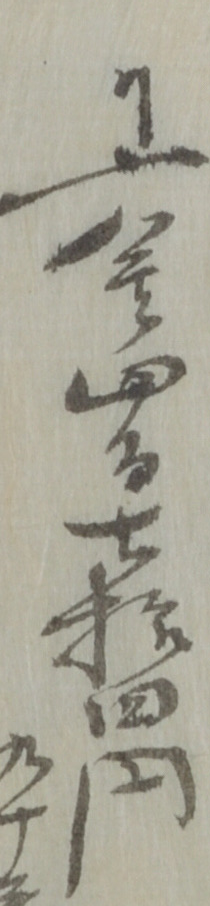同〆金四百七拾四円
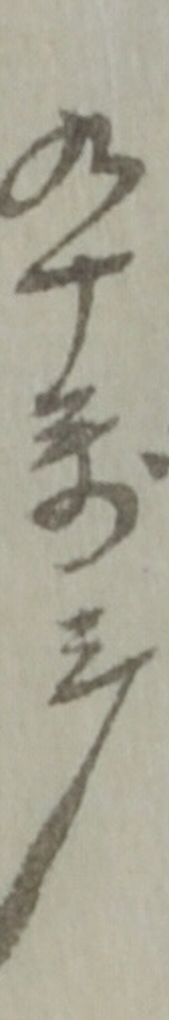九十歩三厘
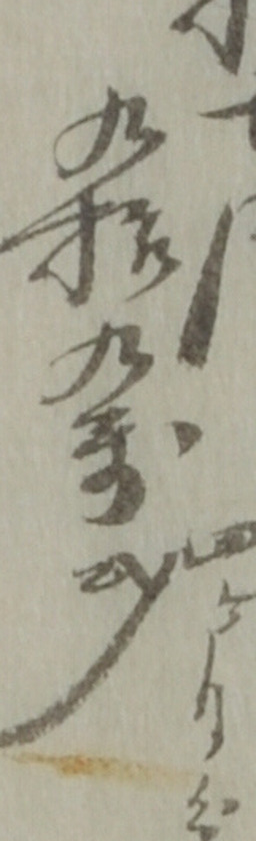九拾九歩弐厘
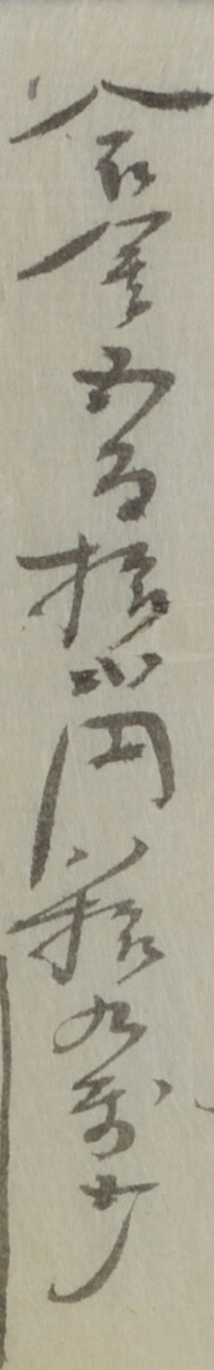合金五百拾弐円八拾九歩五厘
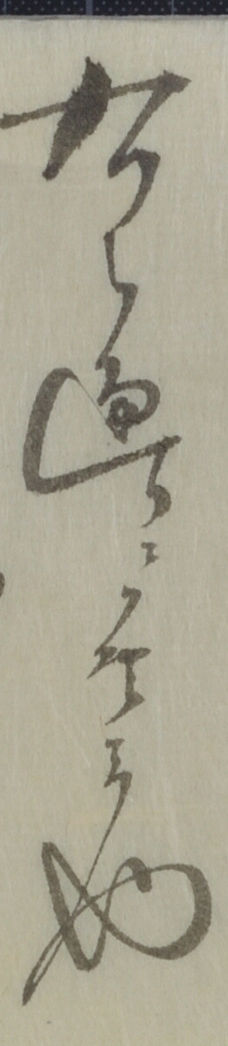右之通り御座候也
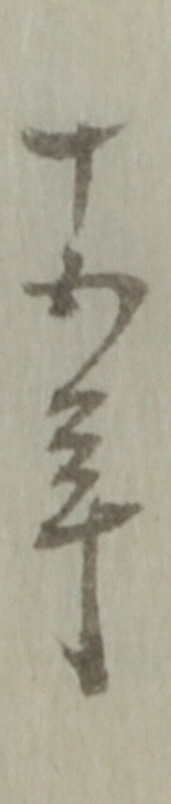十五年
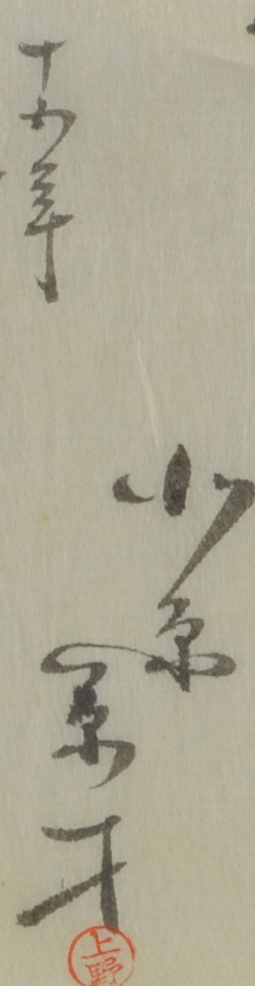十五年
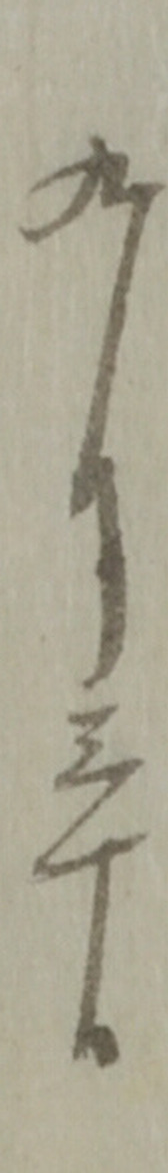九月三十日
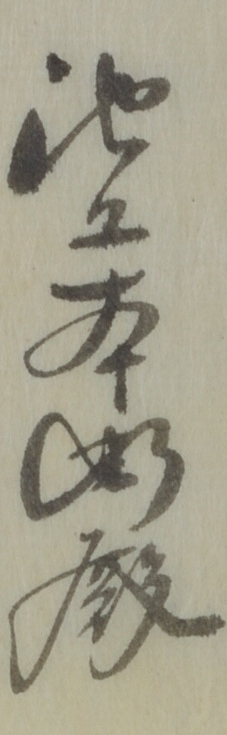池上本衛殿
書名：製糸請取通外
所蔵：伊那市立高遠町図書館・合同会社AMANE
